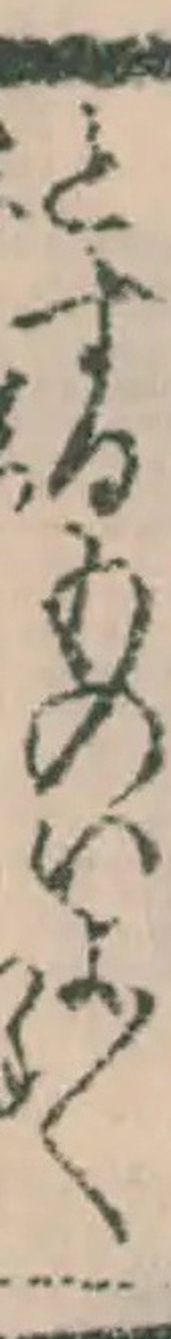とするものいよ〳〵
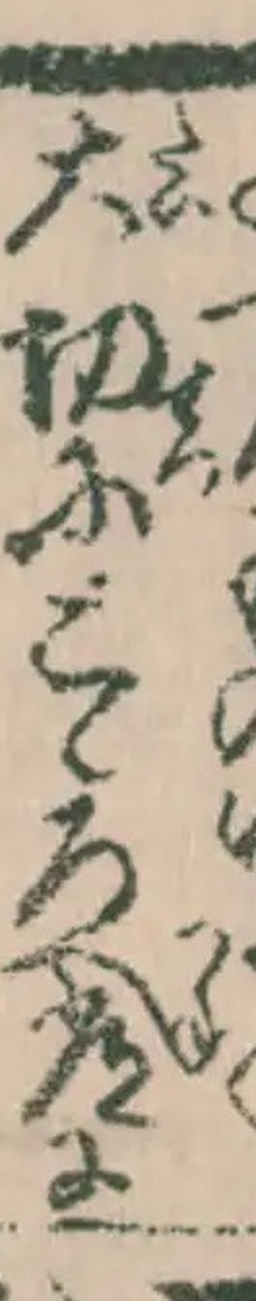大切にこゝろへ常に
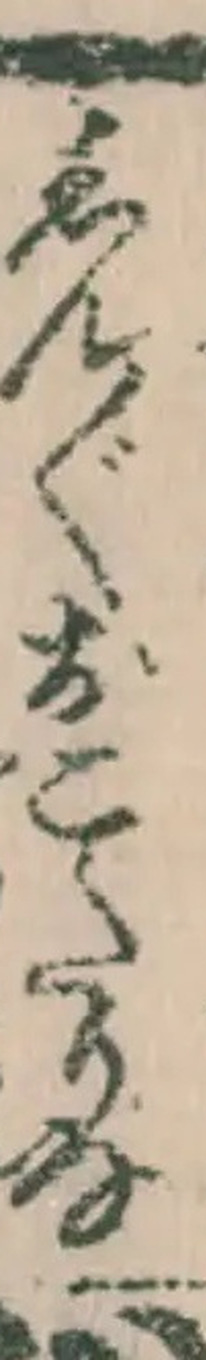しん〴〵おこたりな
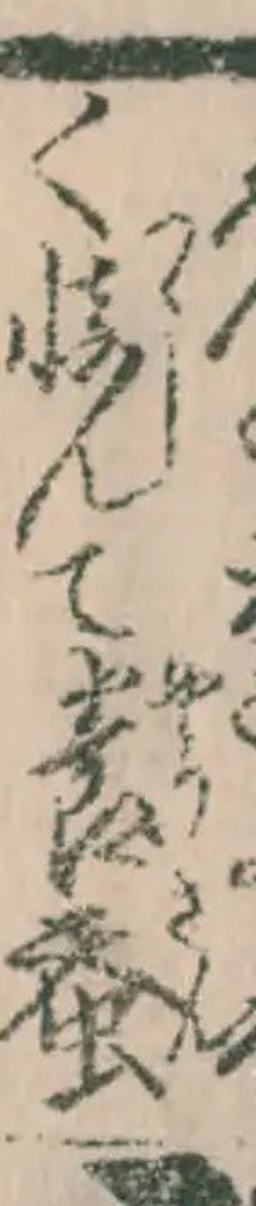く慎んて養蚕
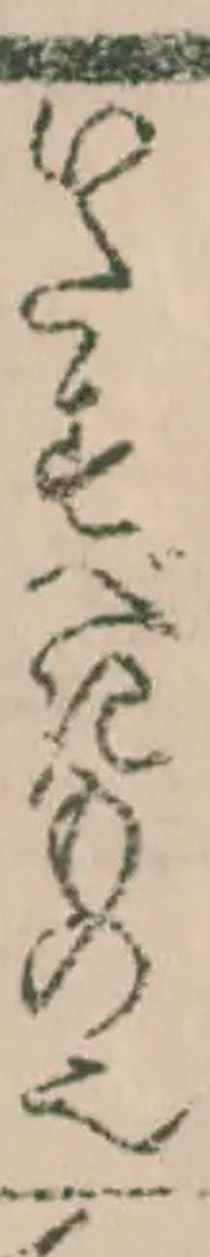いたすべきもの也
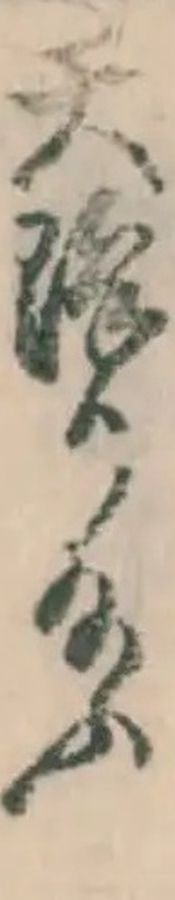天降り給ふ

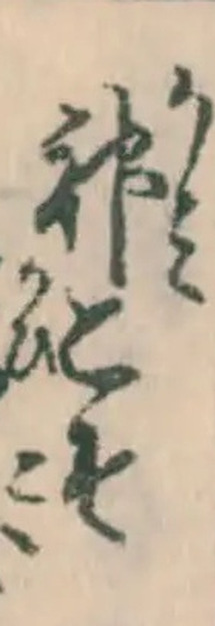神こそ
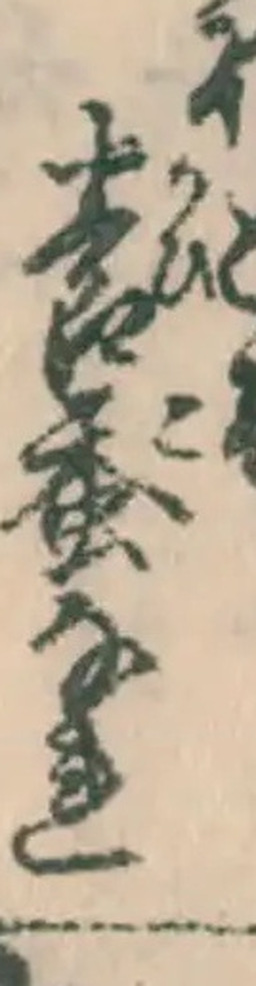養蚕なれ
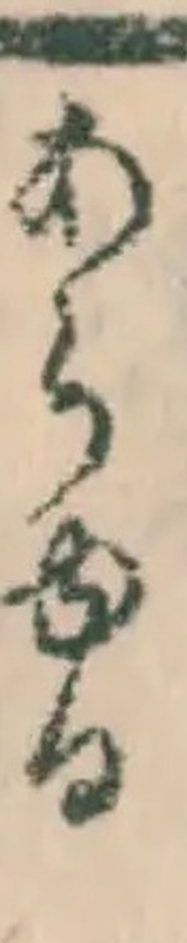あらゆる
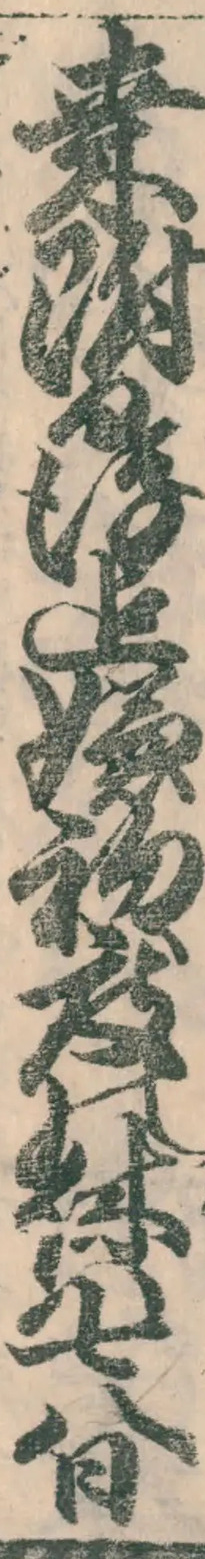桑附る後迄嫌初度の休は七八日
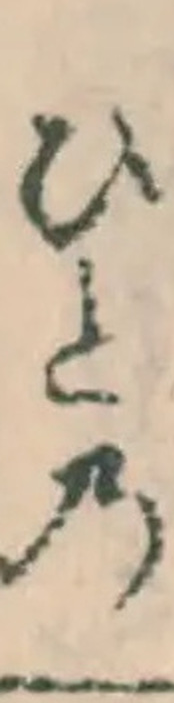ひとの
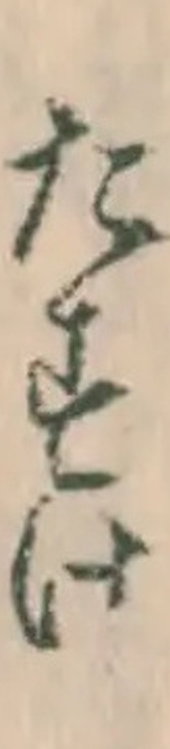たすけ
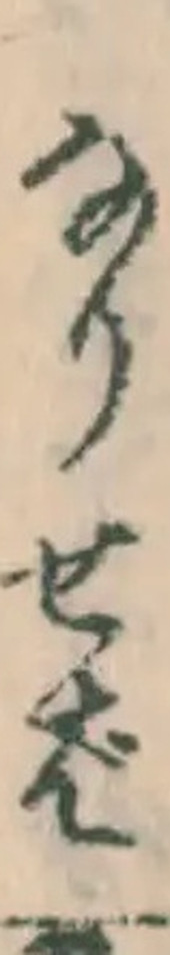なりせば
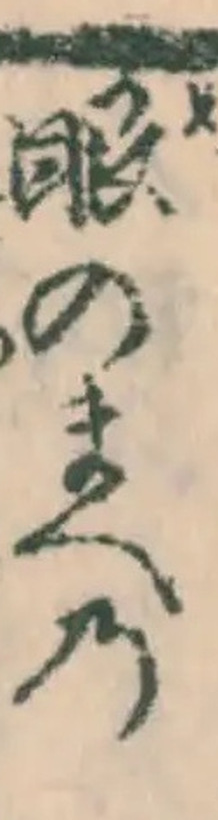眼のまへの
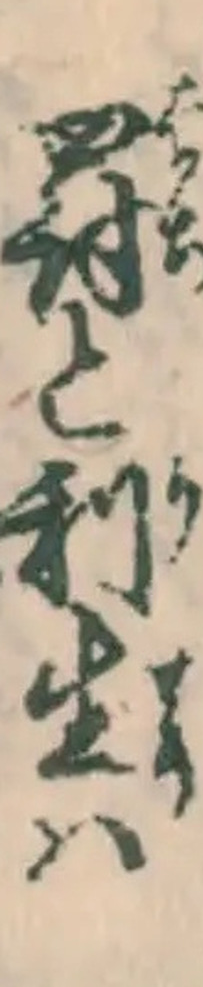罰と利生は
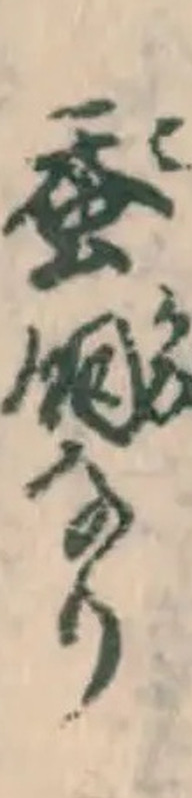蚕飼なり
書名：養蚕往来
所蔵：国立国会図書館 National Diet Library, JAPAN
